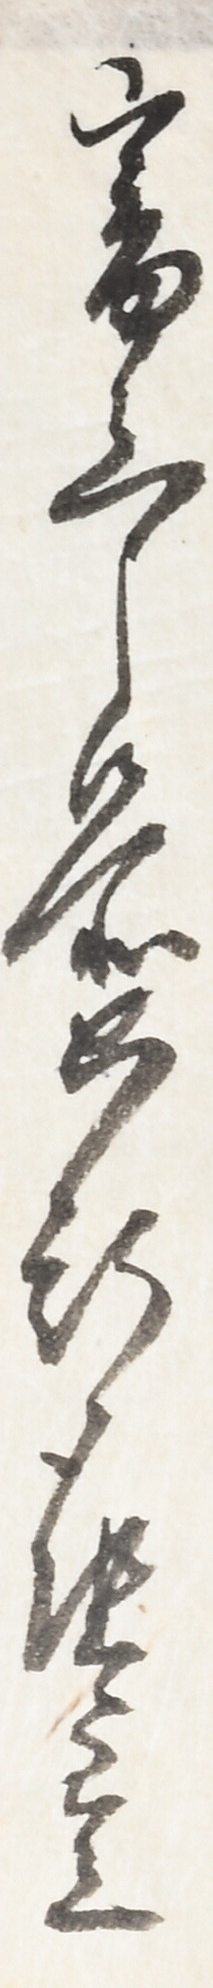書上候所如斯御座候已上
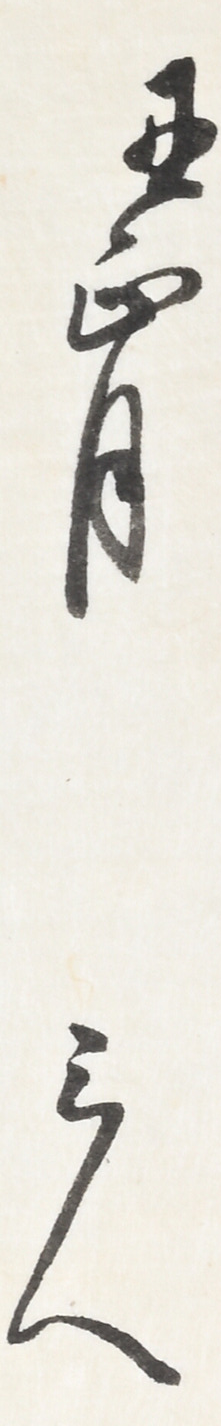丑正月三人

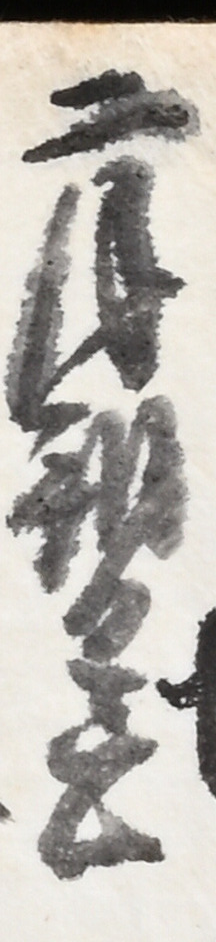二月朔日着
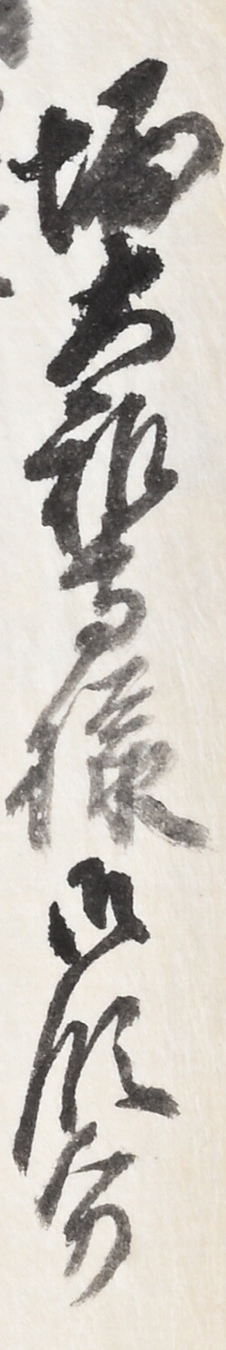堀大和守様御領分
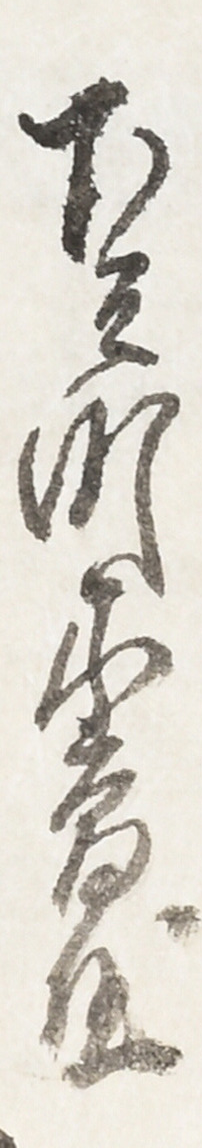下モ町木曽屋
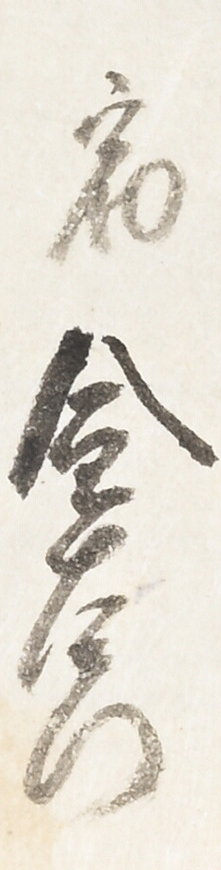宿金右衛門
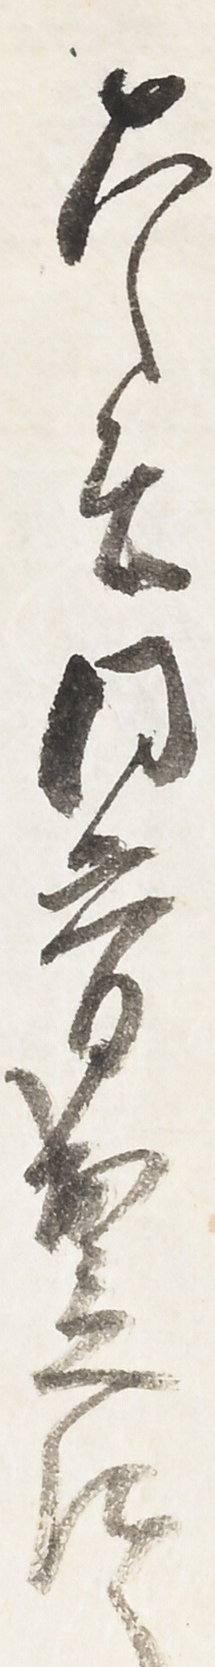右之者同六日出立仕候
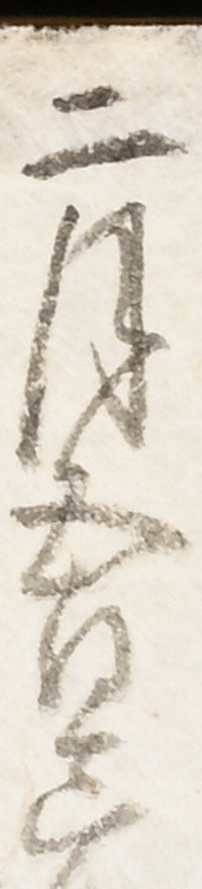二月朔日着
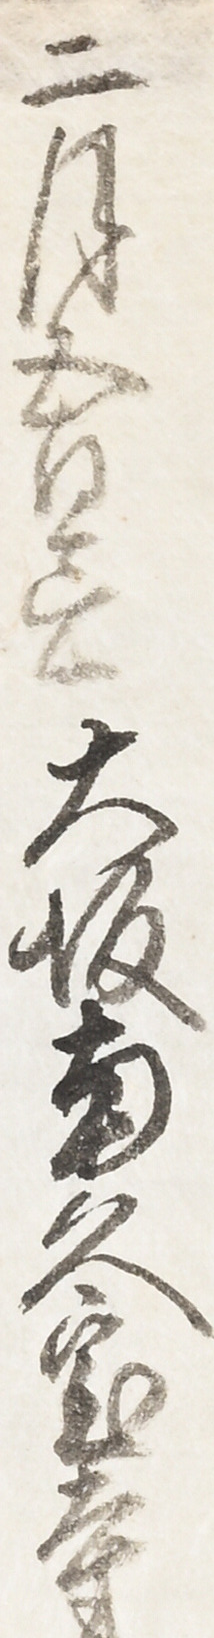二月五日着大坂南久宝寺町
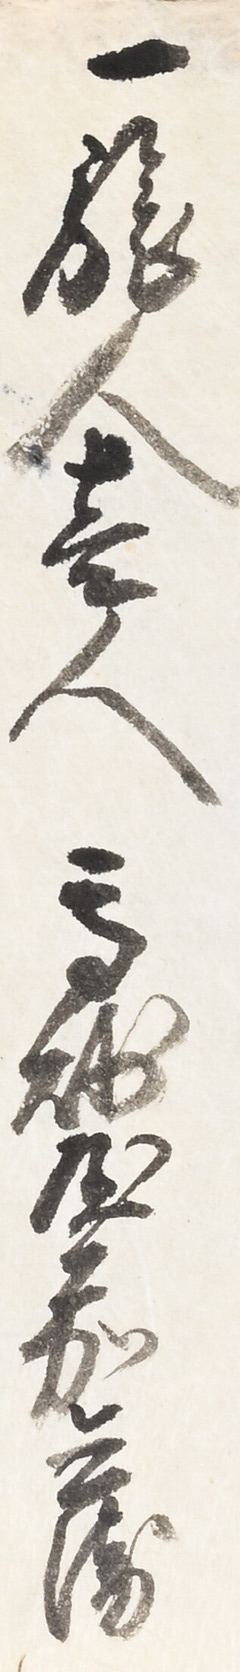一旅人壱人高砂屋嘉兵衛
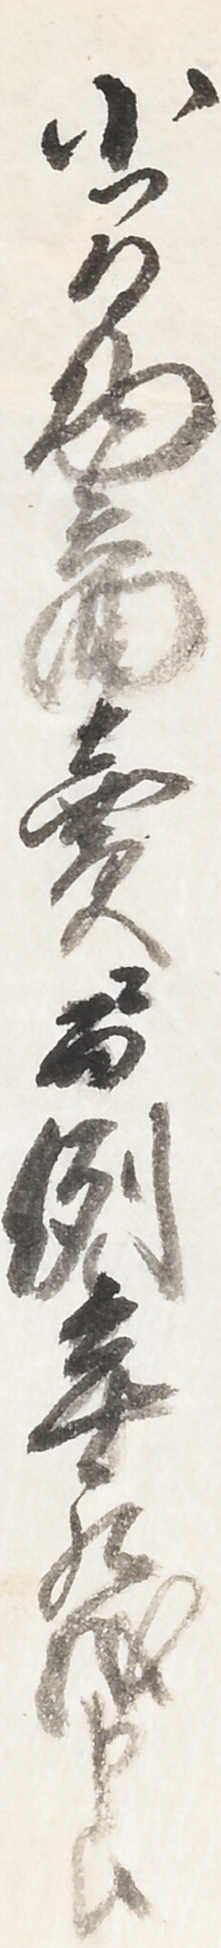小間物商売ニ而例年罷越申候
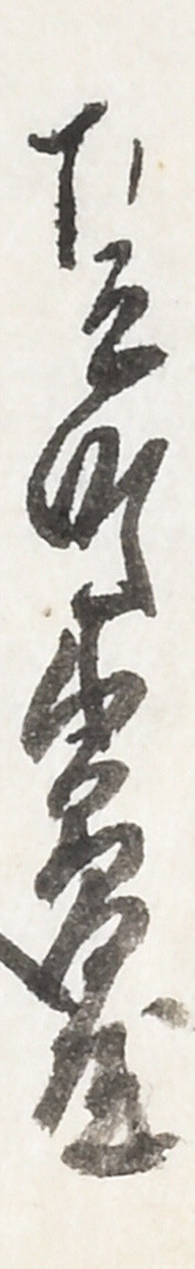下モ町木曽屋
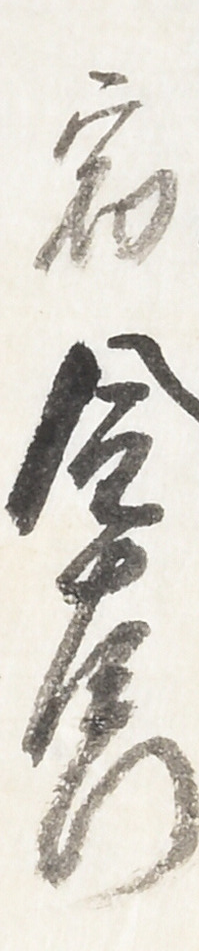宿金右衛門
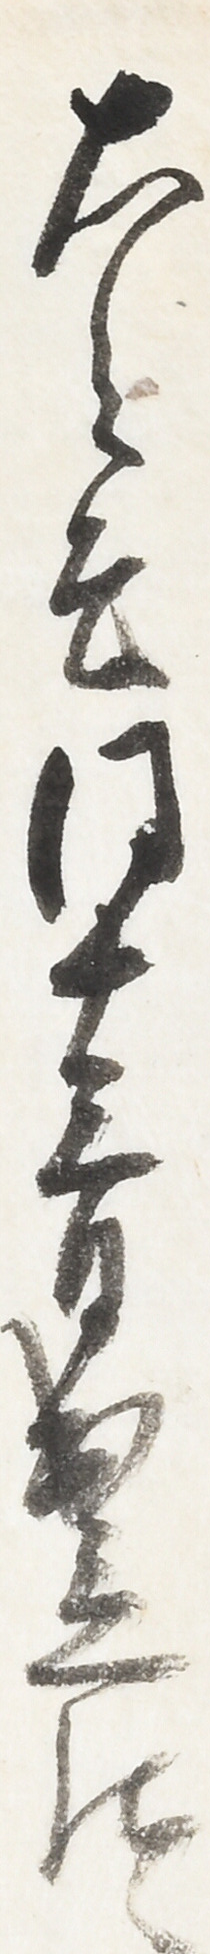右之者同十三日出立仕候
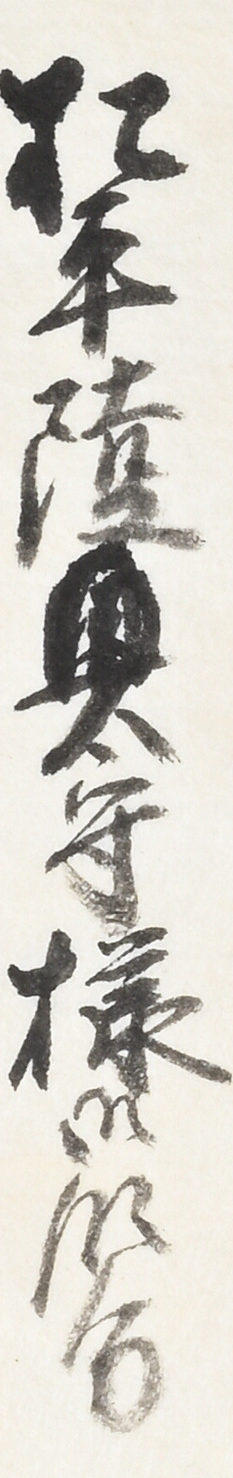松平陸奥守様御領分
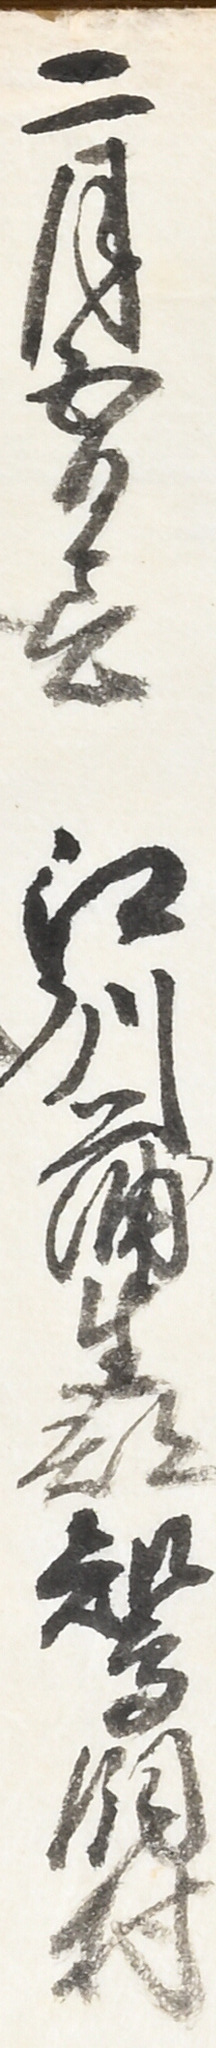二月五日着江州蒲生郡鷹飼村
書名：旅人泊控帳
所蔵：伊那市立高遠町図書館・合同会社AMANE
